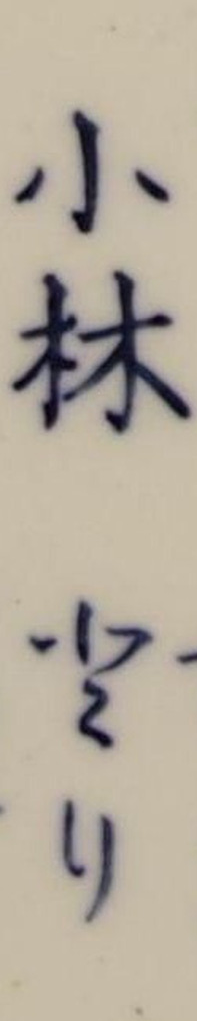小林とり
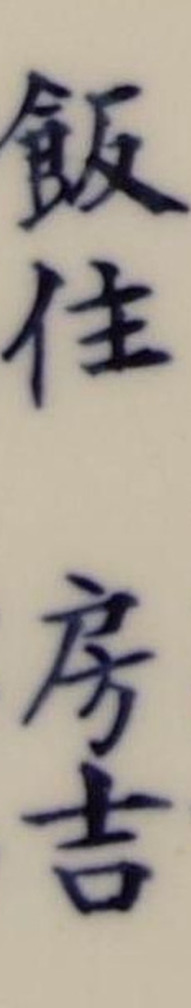飯住房吉
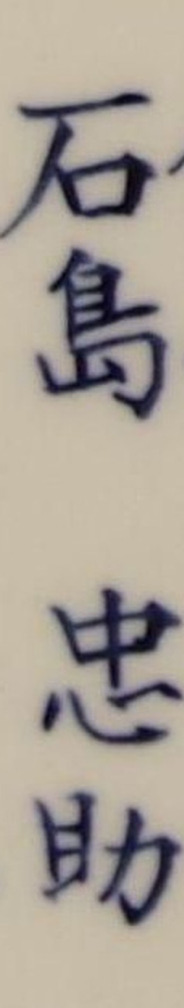石島忠助
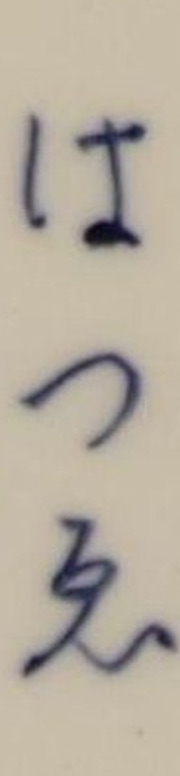はつえ

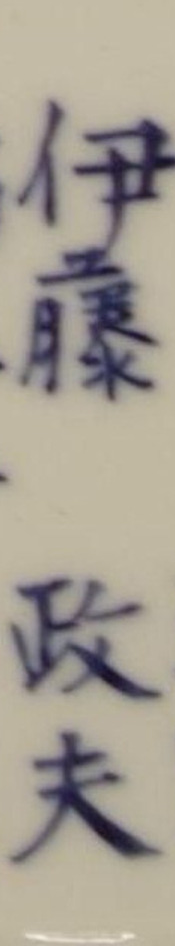伊藤政夫
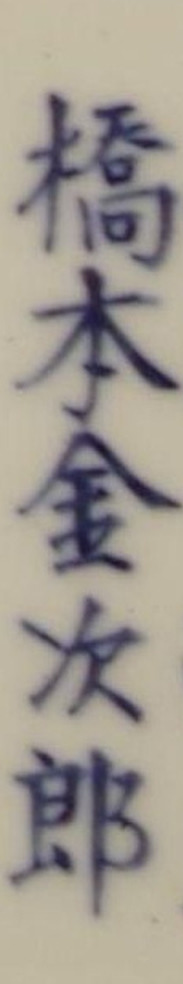橋本金次郎
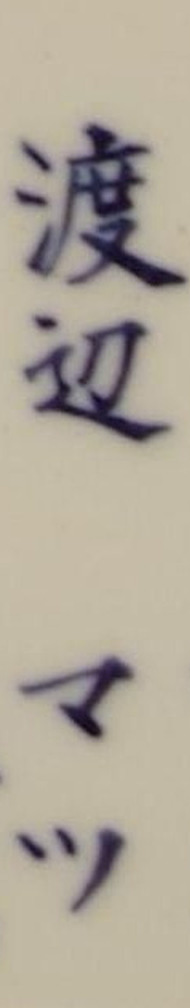渡辺マツ
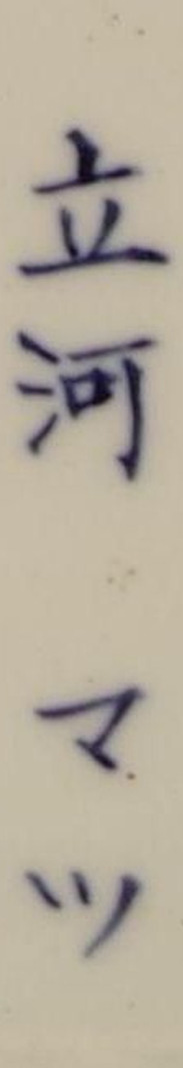立河マツ
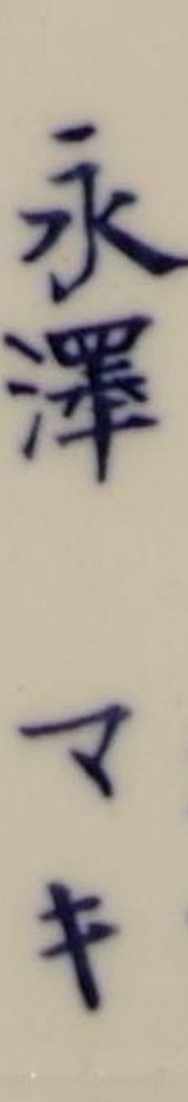永澤マキ
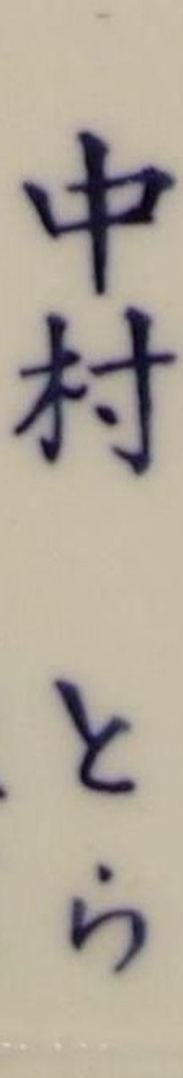中村とら
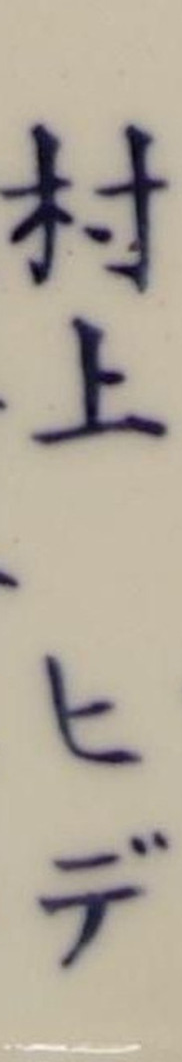村上ヒデ
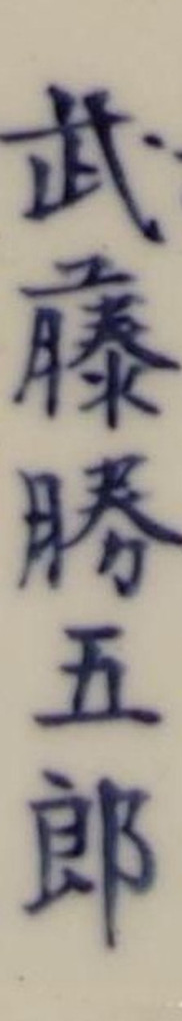武藤勝五郎
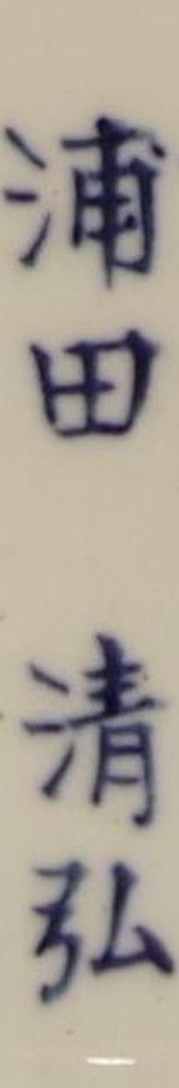浦田清弘
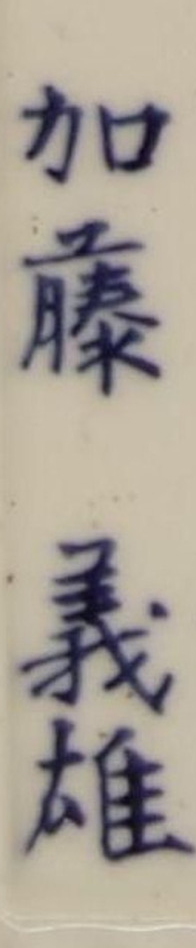加藤義雄

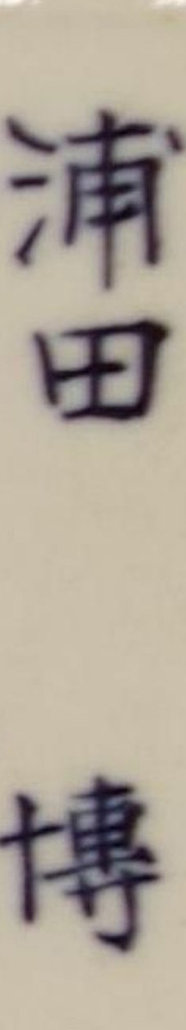浦田博
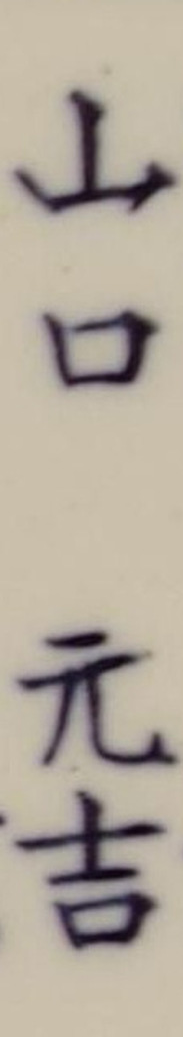山口元吉
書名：E~L
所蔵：高野山金剛峯寺
